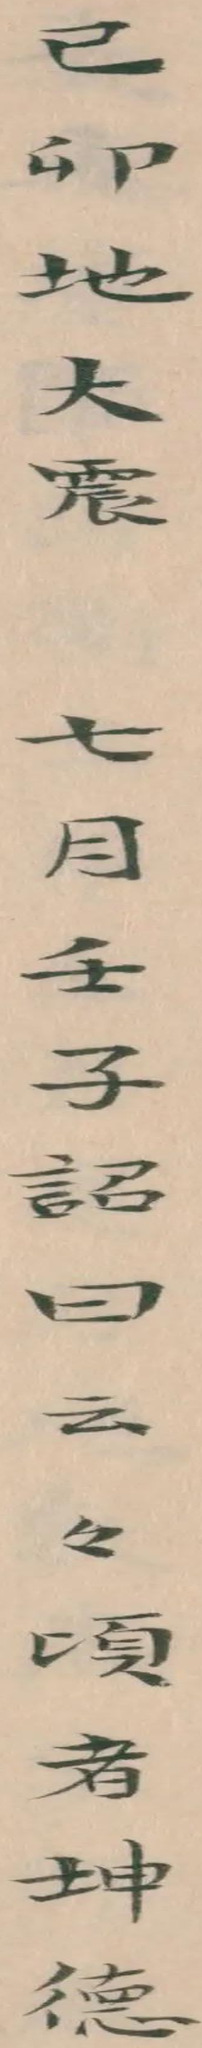己卯地大震七月壬子詔曰云々頃者坤徳
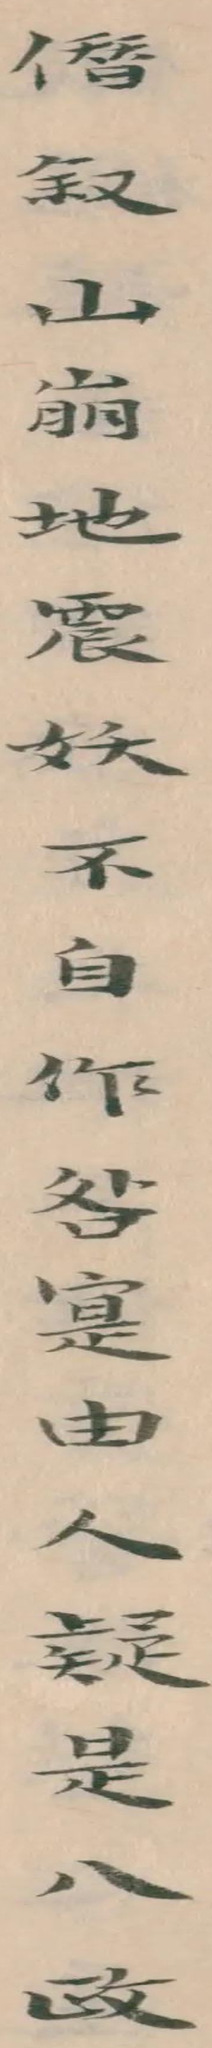僣叙山崩地震妖不自作咎寔由人疑是八政
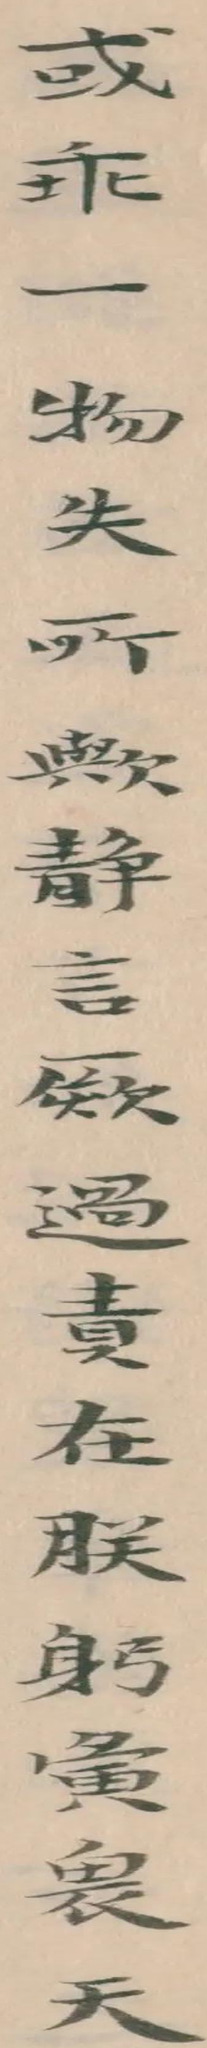或乖一物失所歟静言厥過責在朕躬夤畏天
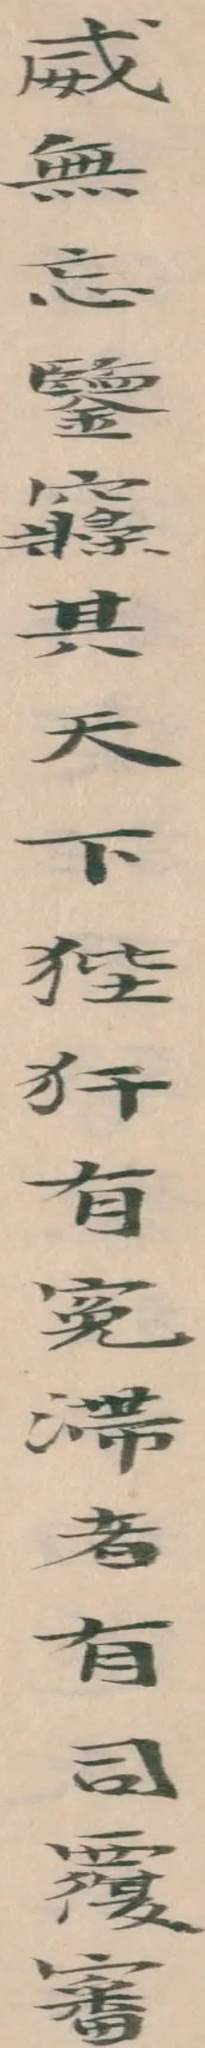威無忘鑑其天下狴犴有寃滞者有司覆審
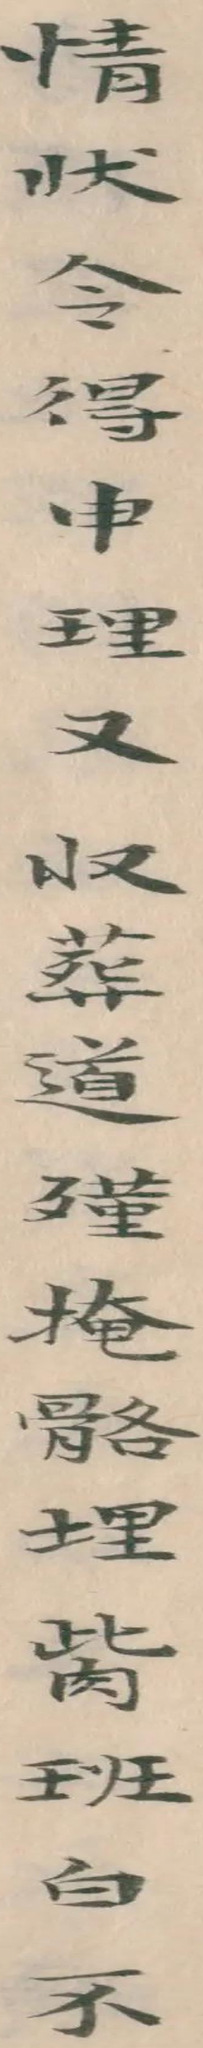情状令得申理又収葬道殣掩骼埋胔班白不
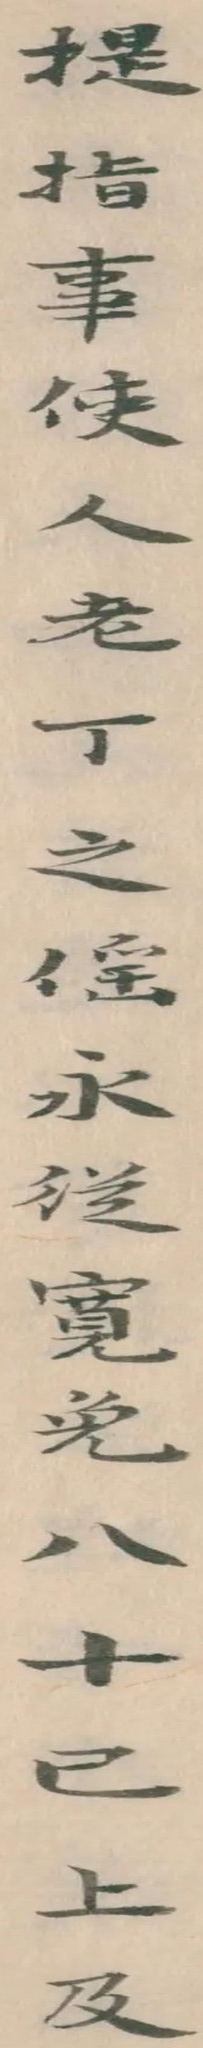提指事使人老丁之傜永従寛免八十已上及
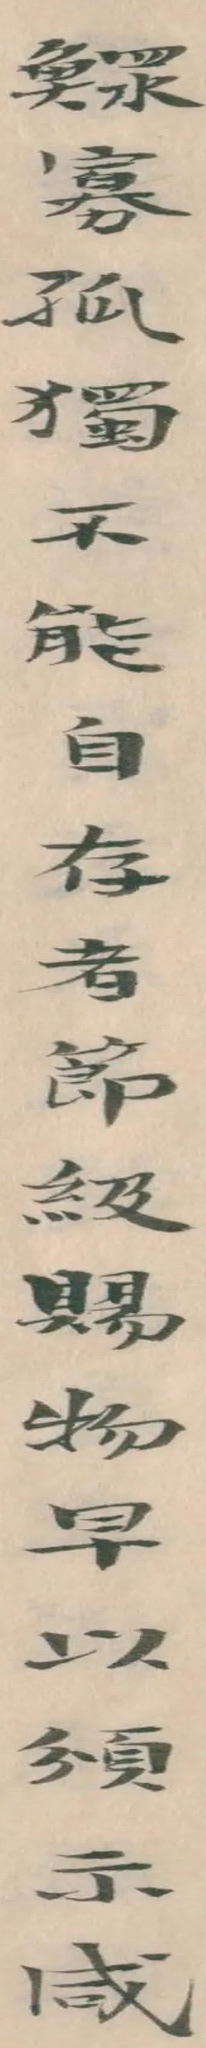鰥寡孤独不能自存者節級賜物早以須示咸
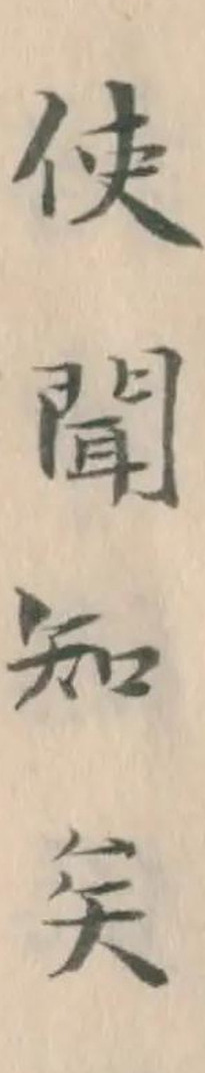使聞知矣
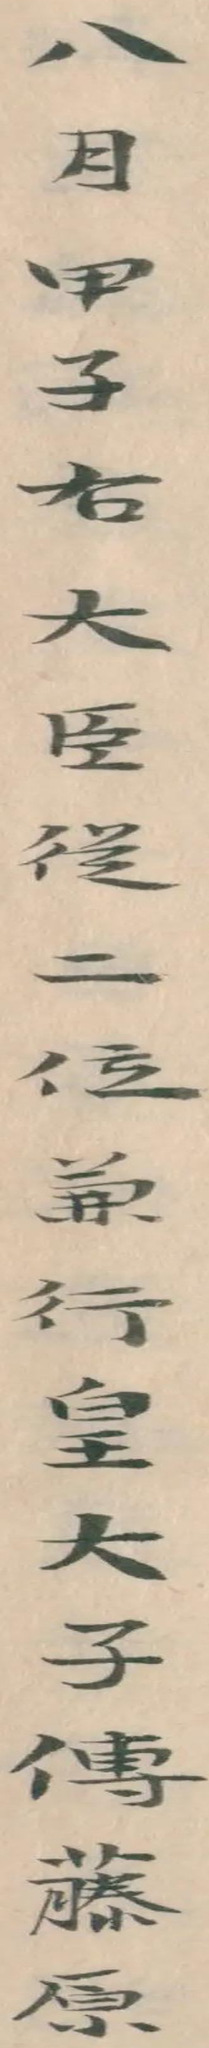八月甲子右大臣従二位兼行皇大子傅藤原

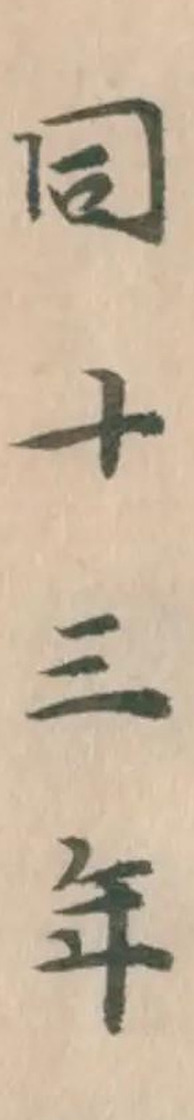同十三年
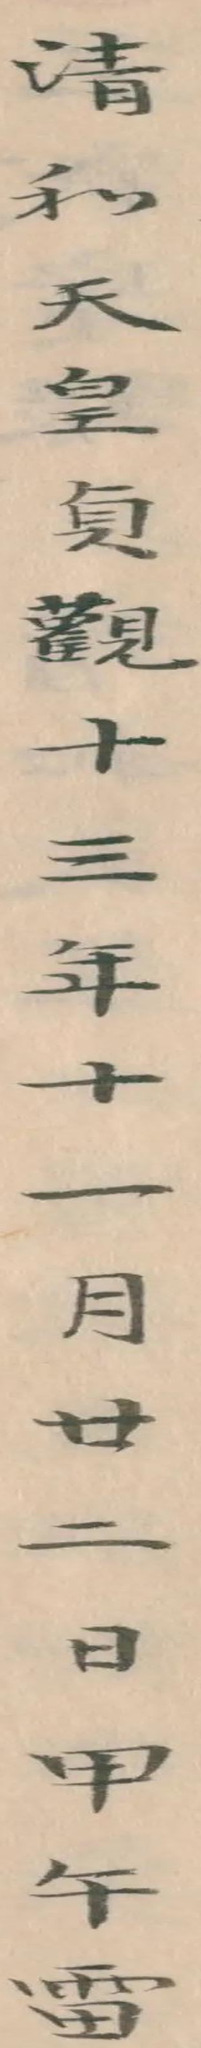清和天皇貞観十三年十一月廿二日甲午雷
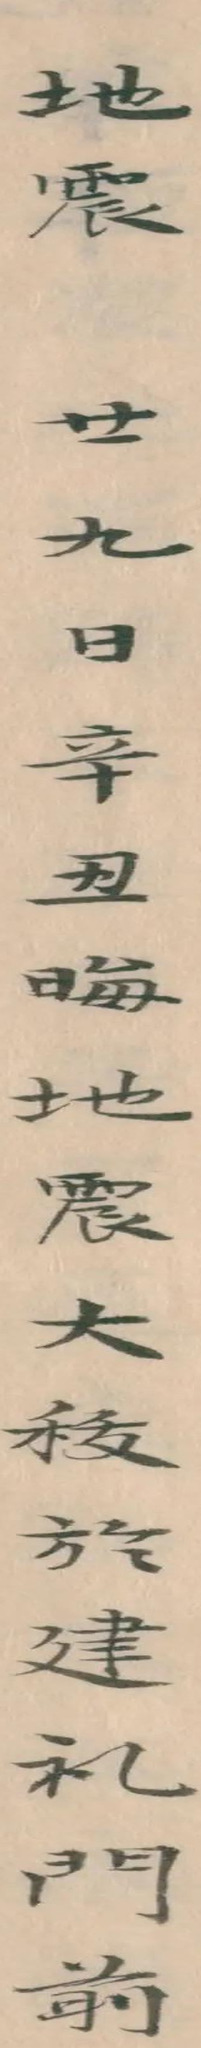地震廿九日辛丑晦地震大祓於建礼門前
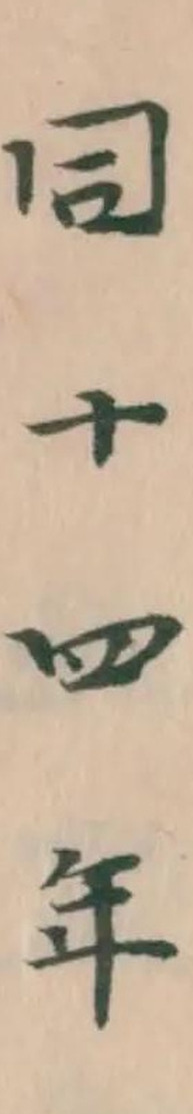同十四年
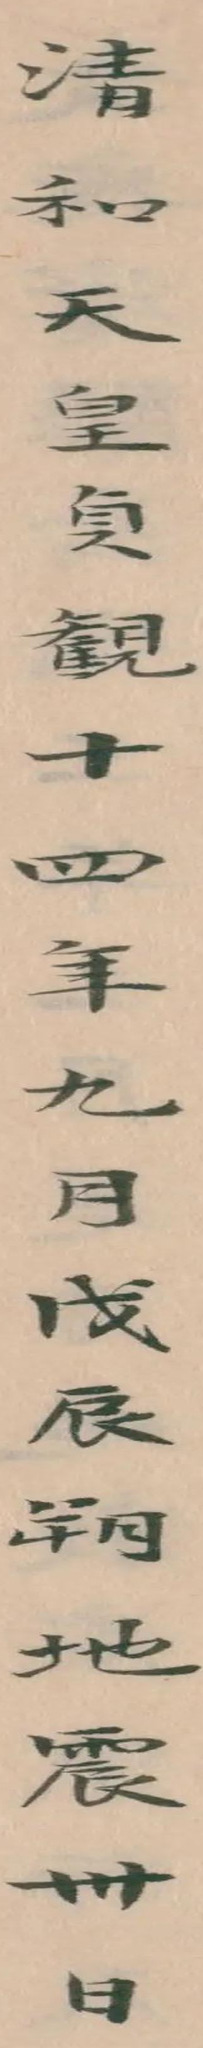清和天皇貞観十四年九月戊辰朔地震丗日
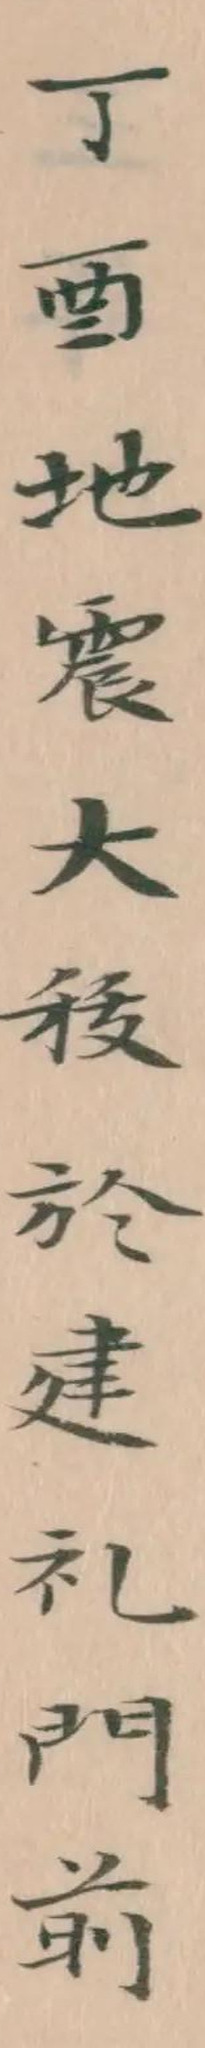丁酉地震大祓於建礼門前
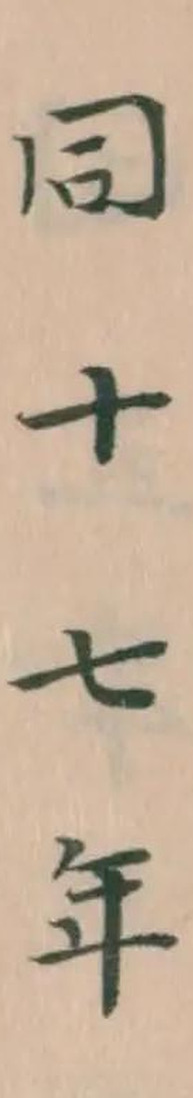同十七年
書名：地災撮要. 巻5-6(地震之部)
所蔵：国立国会図書館 National Diet Library, JAPAN
